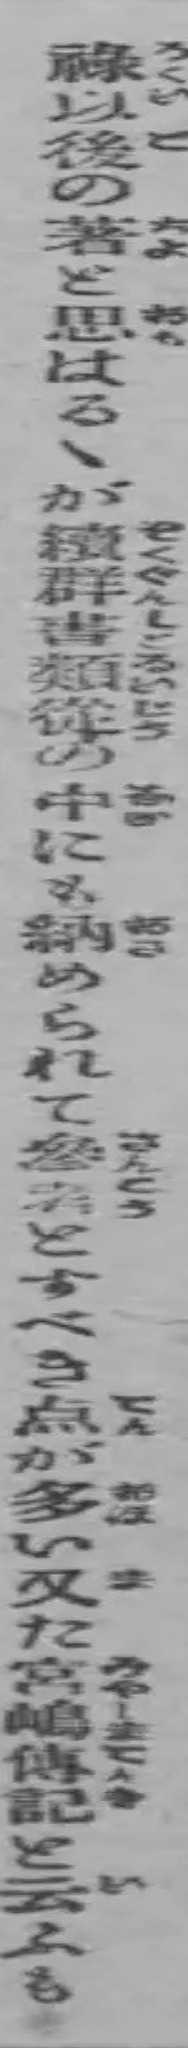禄以後の著と思はるゝが続群書類従の中にも納められて参考とすべき点が多いま又た宮嶋伝記と云ふも
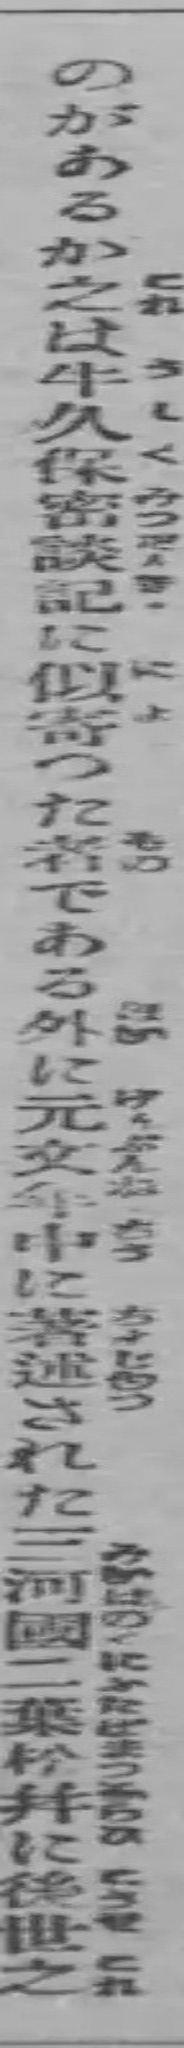のがあるか之は牛久保密談記に似寄つた者である外に元文年中に著述された三河国二葉松幷に後世之
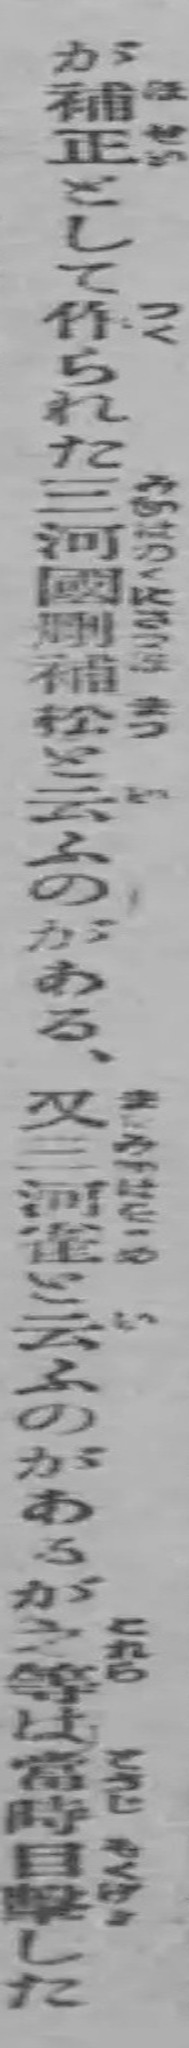が補正として作られた三河国刷補松と云ふのがある、又三河雀と云ふのがあるが之等は当時目撃した
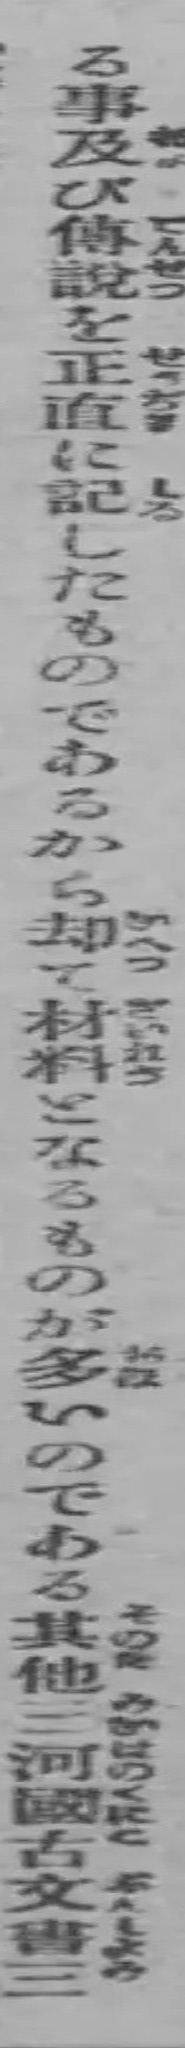る事及び伝説を正直に記したものであるから却て材料となるものが多いのである其他三河国古文書三
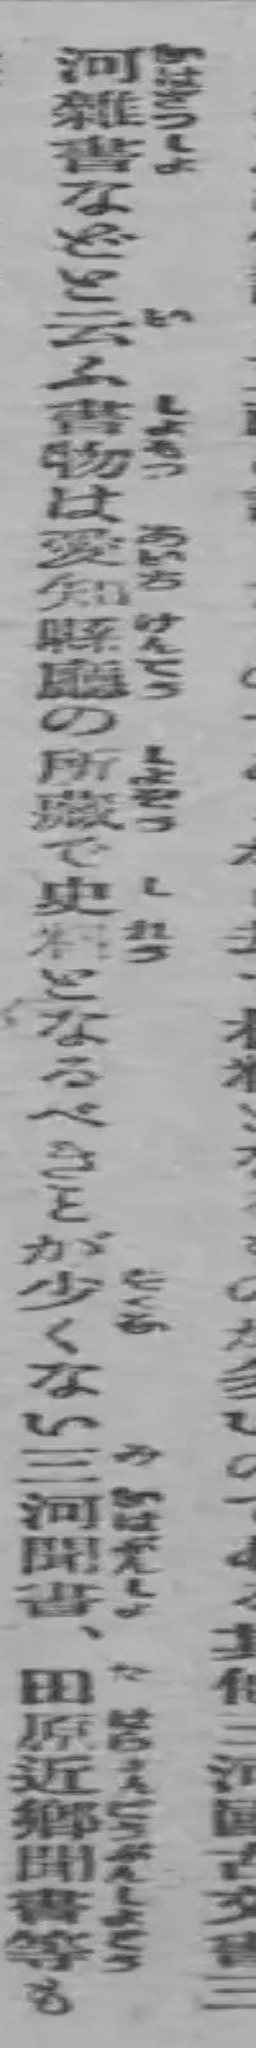河雑書などと云ふ書物は愛知県庁の所蔵で史料となるべきことが少くない三河聞書、田原近郷聞書等も
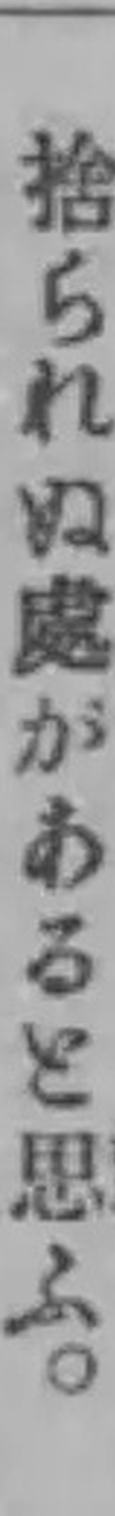捨られぬ処があると思ふ。
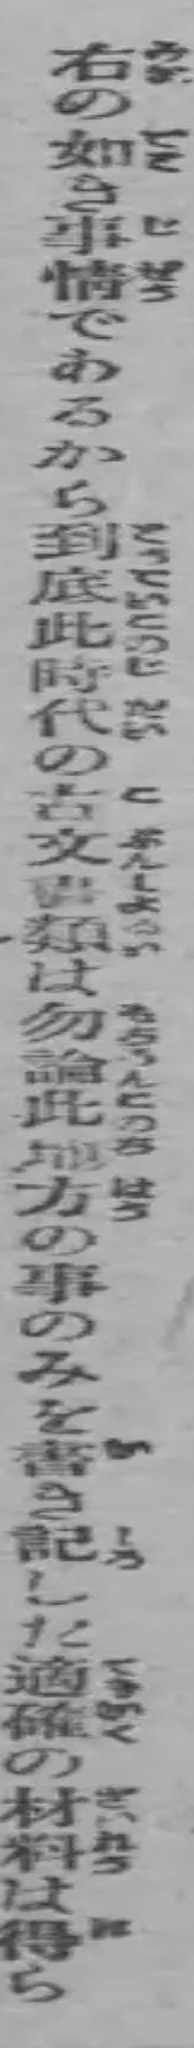右の如き事情であるから到底此時代の古文書類は勿論此地方の事のみを書き記した適確の材料は得ら
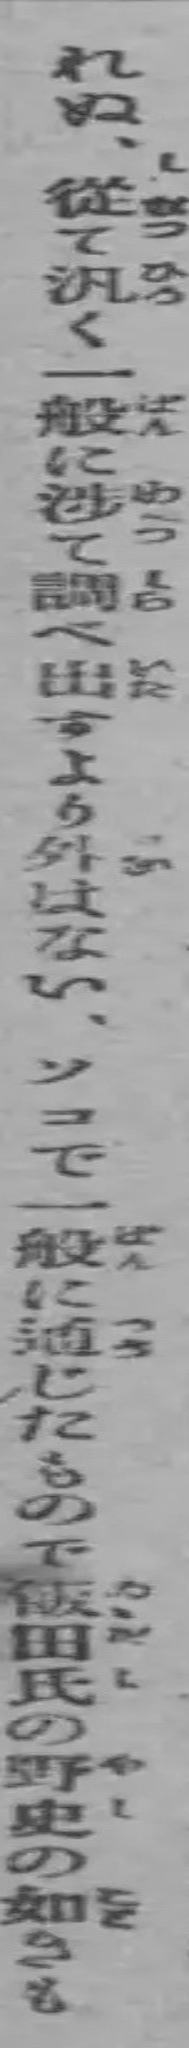れぬ、従て汎く一般に渉て調べ出すより外はない、ソコで一般に通じたもので飯田氏の野史の如きも

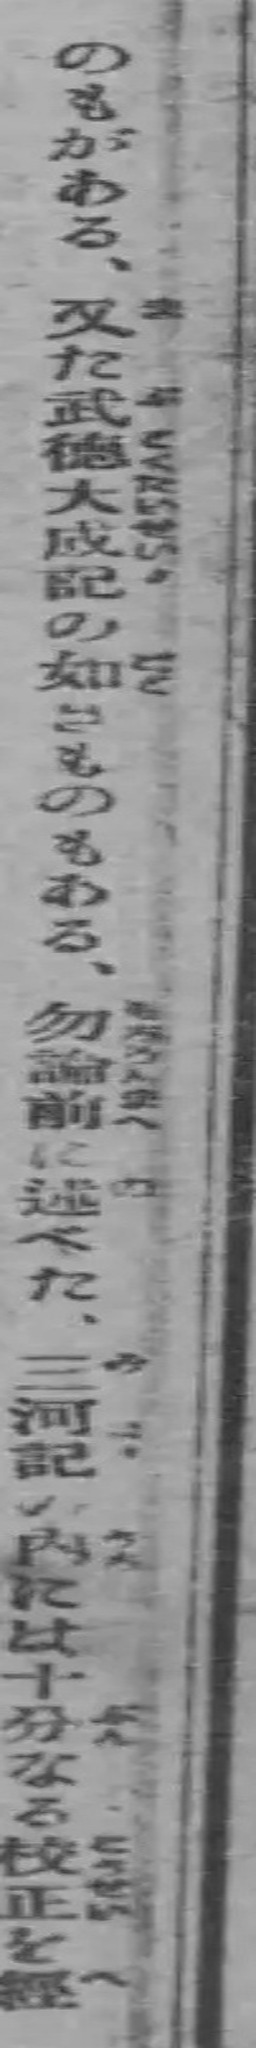のもがある、又た武徳大成記の如きものもある、勿論前に述べた、三河記の内には十分なる校正を経
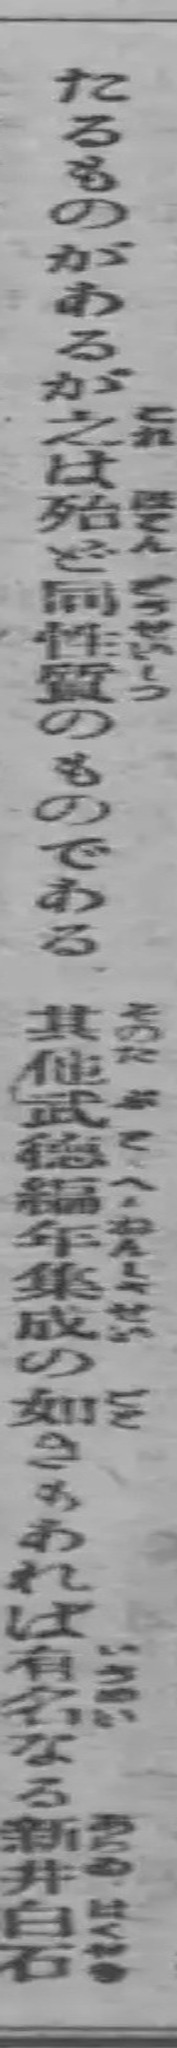たるものがあるが之は殆ど同性質のものである、其他武徳編年集成の如きもあれば有名なる新井白石
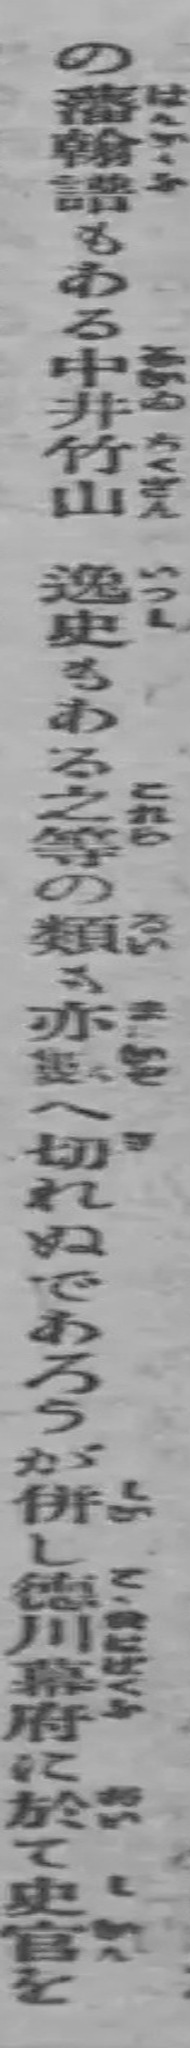の藩翰譜もある中井竹山の逸史もある之等の類も亦数へ切れぬであろうが併し徳川幕府に於て史官を
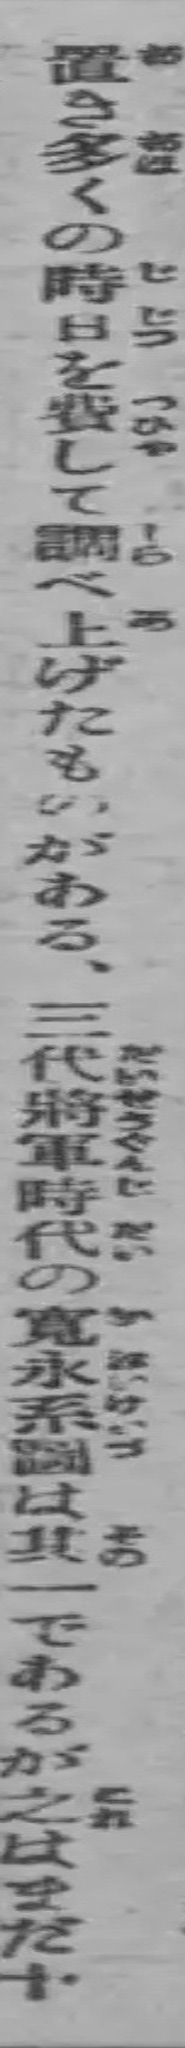寛永系図置き多くの時日を費して調べ上げたものがある、三代将軍時代の寛永系図は其一であるが之はまだ十
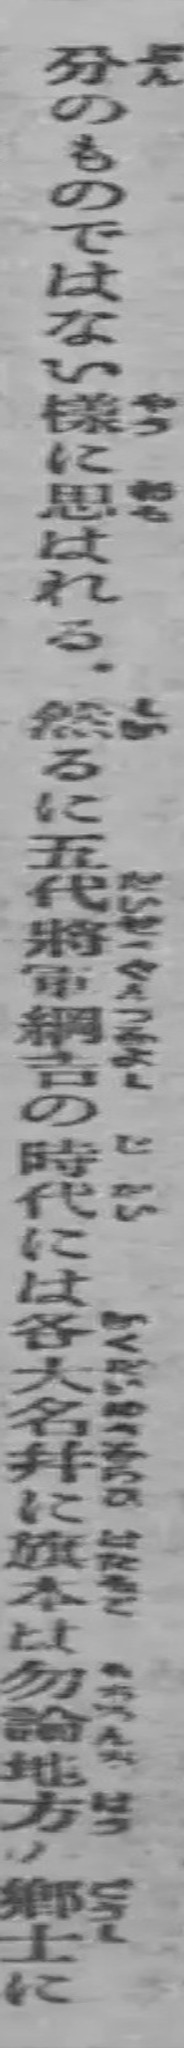分のものではない様に思はれる、然るに五代将軍綱吉の時代には各大名幷に旗本は勿論地方の郷士に
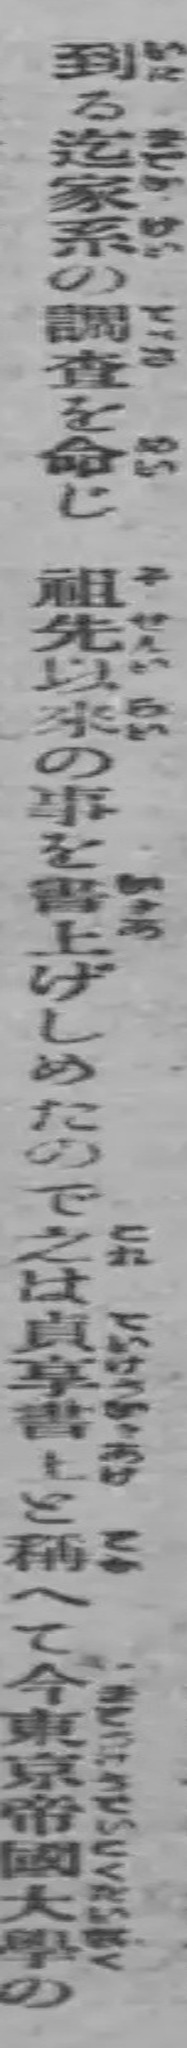貞享書上到る迄家系の調査を命じ祖先以来の事を書上げしめたので之は貞享書上と称へて今東京帝国大学の
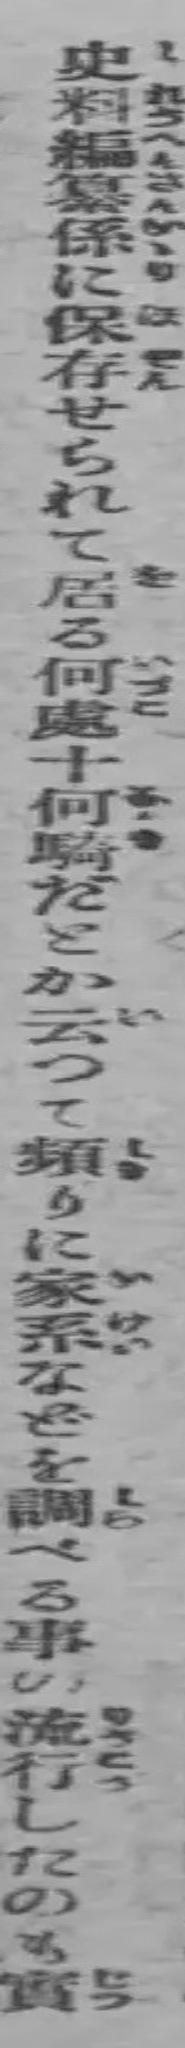史料編纂係に保存せられて居る何処十何騎だとか云つて頻りに家系などを調べる事の流行したのも実
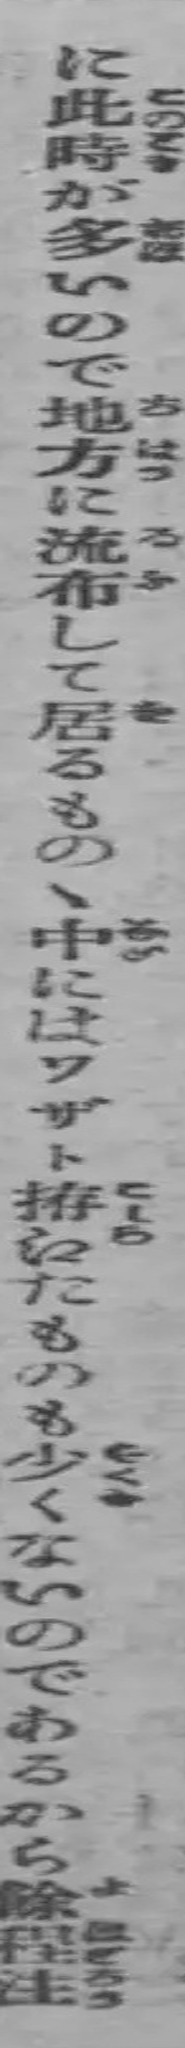に此時が多いので地方に流布して居るものゝ中にはワザト拵えたものも少くないのであるから余程注
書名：豊橋市史談
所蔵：国立国会図書館 National Diet Library, JAPAN
